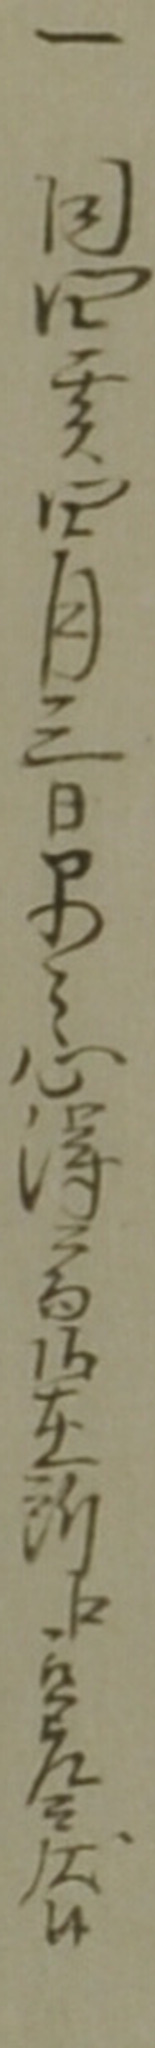一同四亥四月三日早之心得ニ而御在所江被差戻候
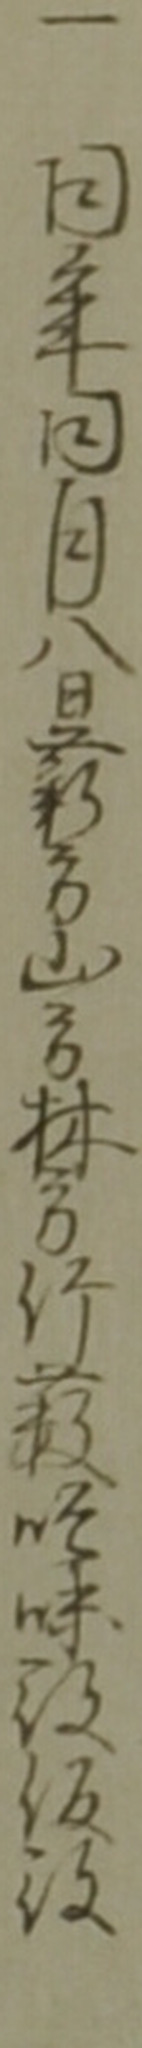一同年同月八日薪方山方林方竹藪吟味役仮役
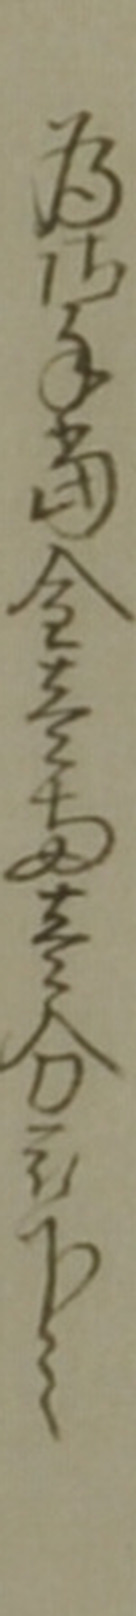為御手当金壱両壱分被下之

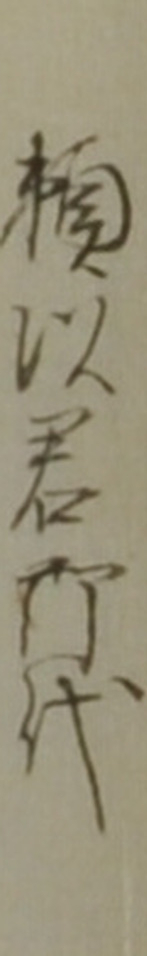頼以君御代
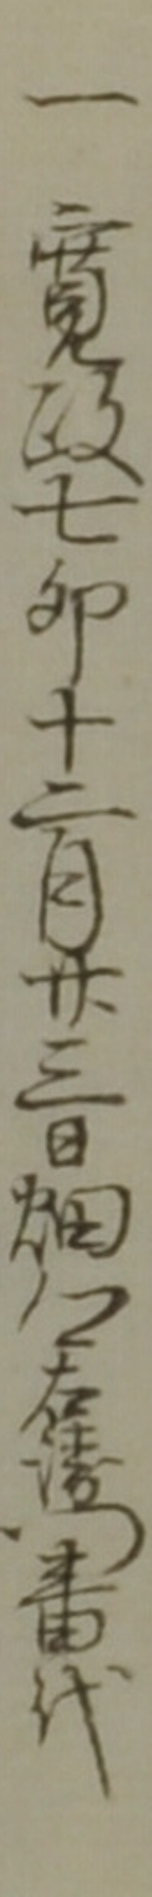一寛政七卯十二月廿三日畑郷右衛門番代
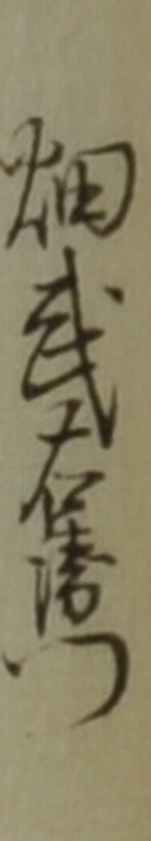畑武右衛門
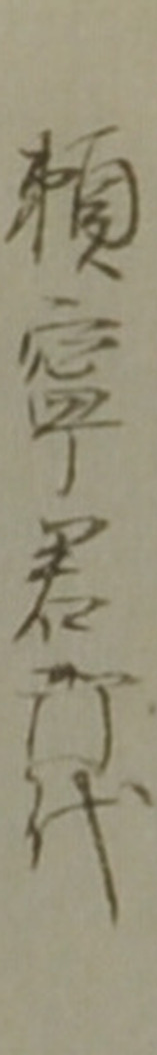頼寧君御代
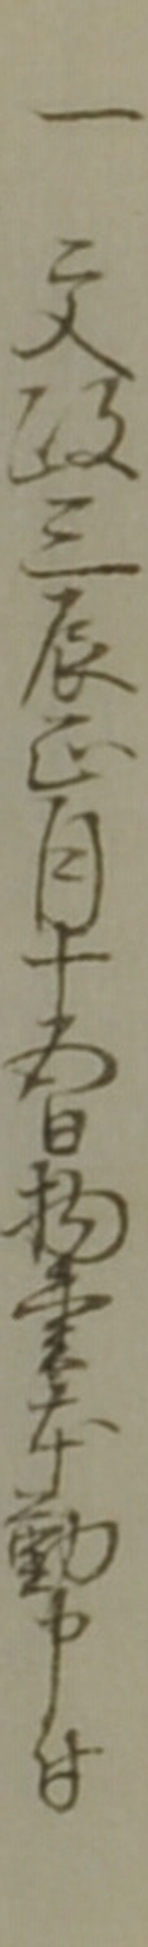一文政三辰正月十五日物書本勤申付
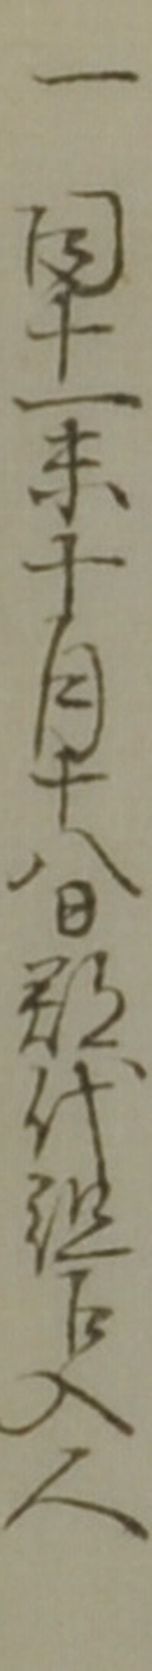一同十一未十月十八日郡代組江入人
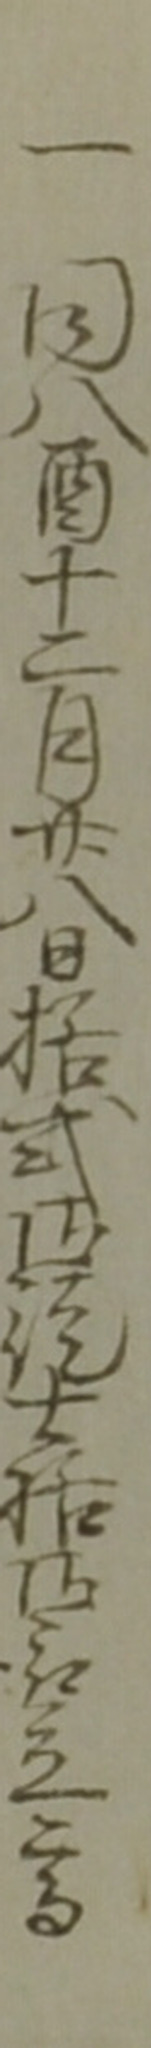一同八酉十二月廿八日格式御徒士格御取立高
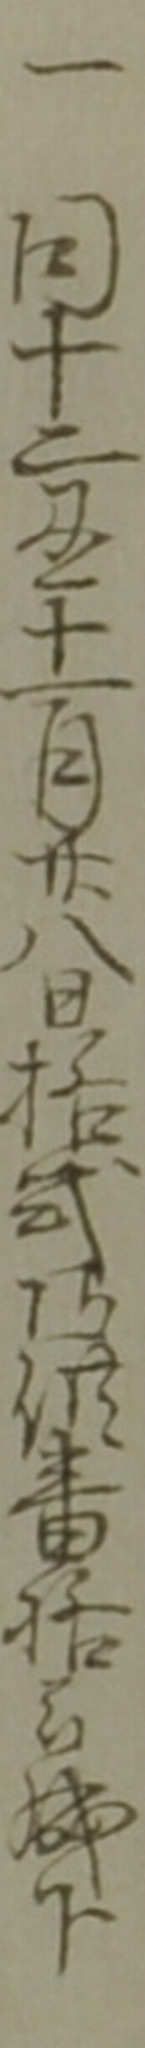一同十二丑十一月廿八日格式御供番格被成下
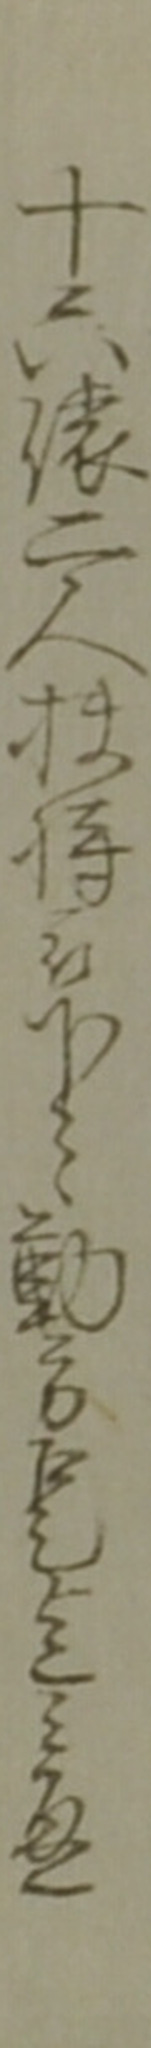十六俵二人扶持被下之勤方是迄之通
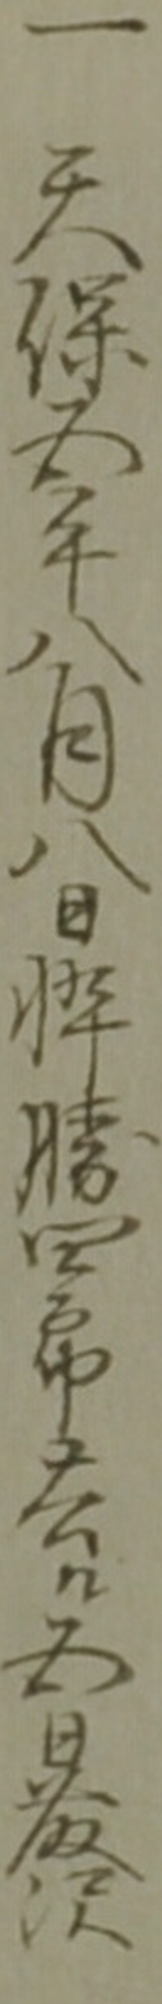一天保五午八月八日忰勝四郎去ル五日藤沢
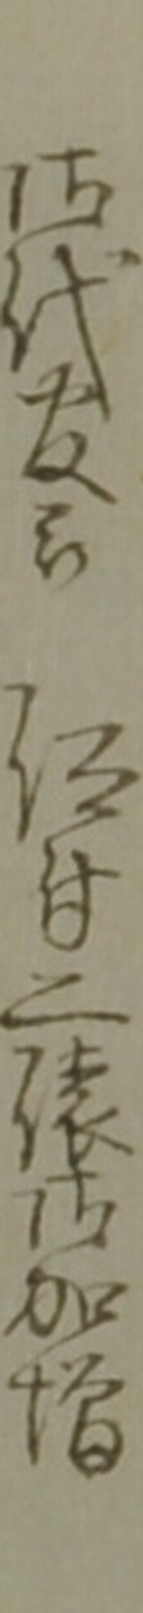御代官被仰付二俵御加増
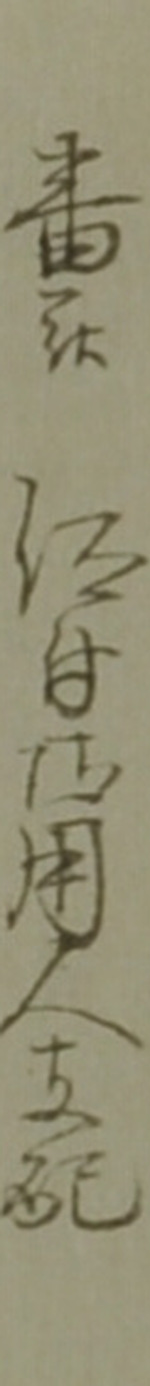番被仰付御用人支配

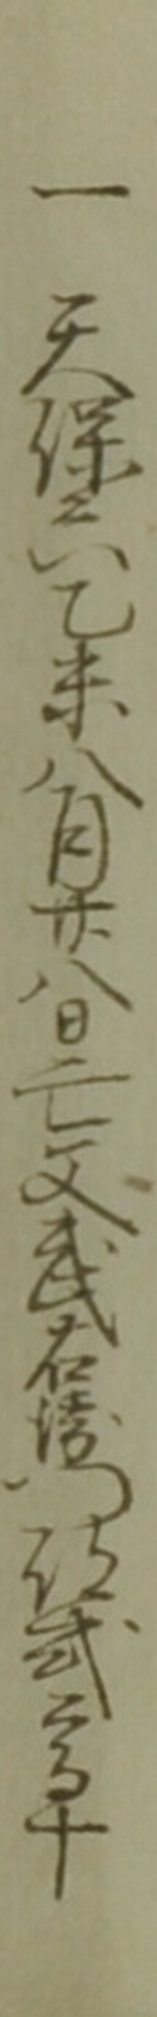一天保六乙未八月廿八日亡父武右衛門跡式高十
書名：無足諸士勤仕録（六）
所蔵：伊那市立高遠町図書館・合同会社AMANE
